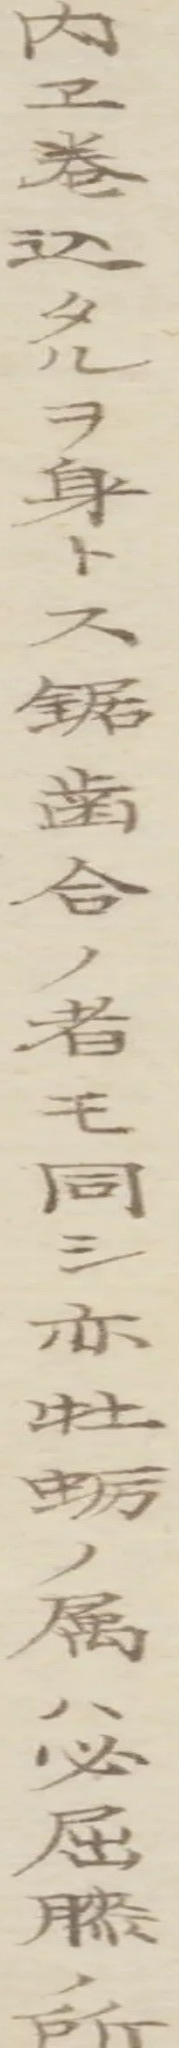内ナリ巻込タルヲ身トス鋸歯合ノ者モ同シ又牡蛎ノ属ハ必屈膝ノ所
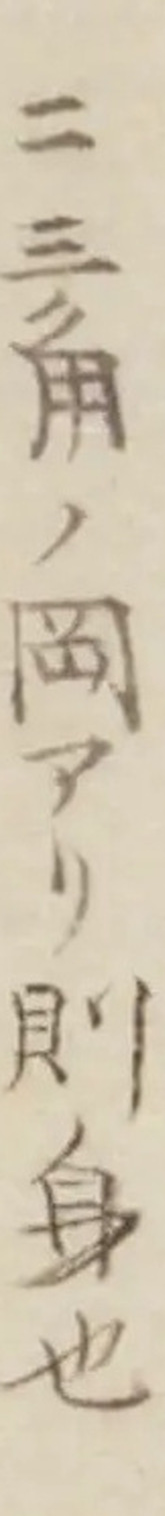ニ三角ノ丘アリ則身也
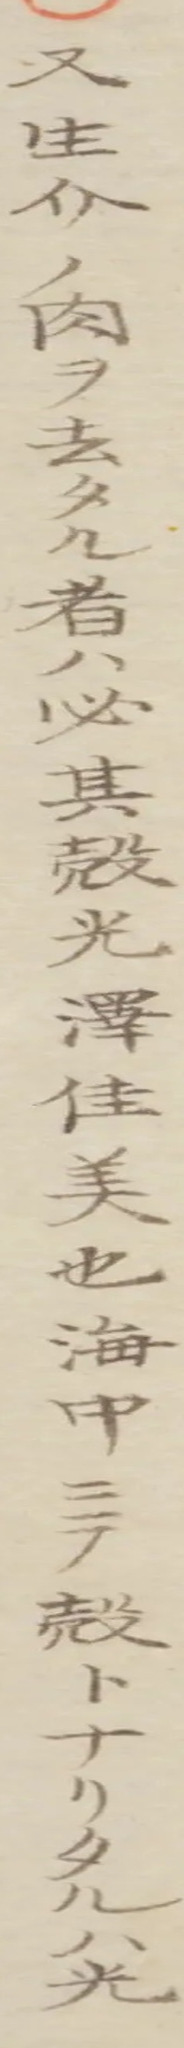○又生介ノ肉ヲ去タル者ハ必其殻光澤華美也海中ニテ殻トナリタルハ光
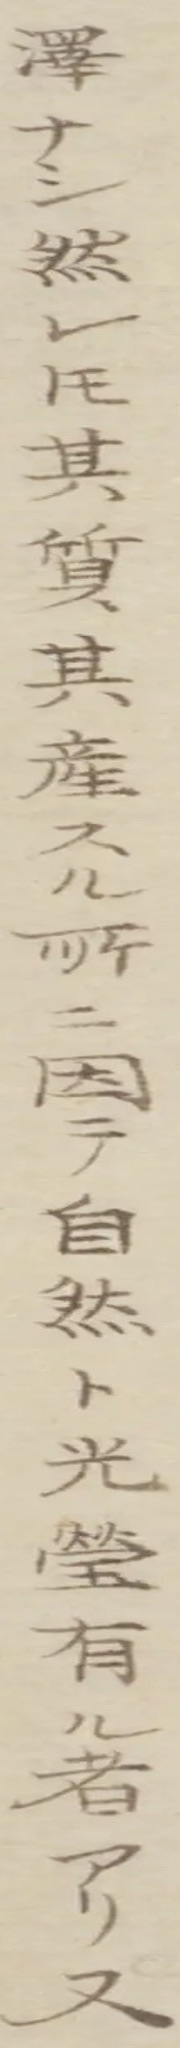澤ナシ然レトモ其質其産スル所ニ依る因テ自然ト光宝有ル者アリ又
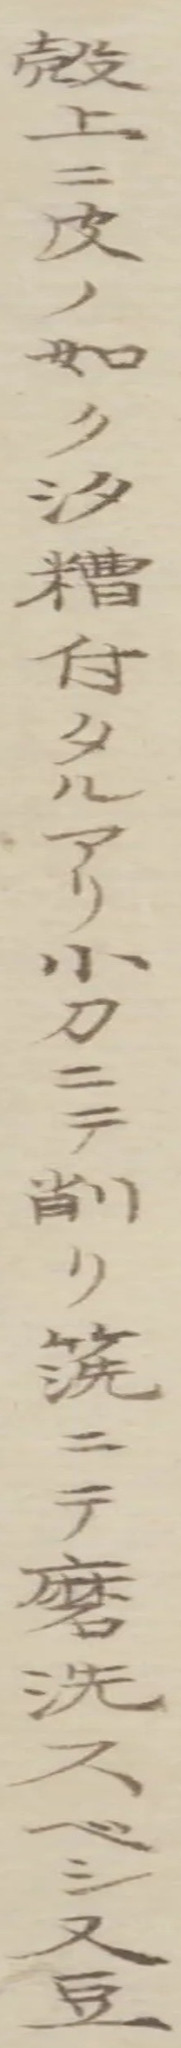殻上ニ皮ノ如ク汐槽付タルアリ小刀ニテ削リ箲ニテ磨洗スベシ又豆

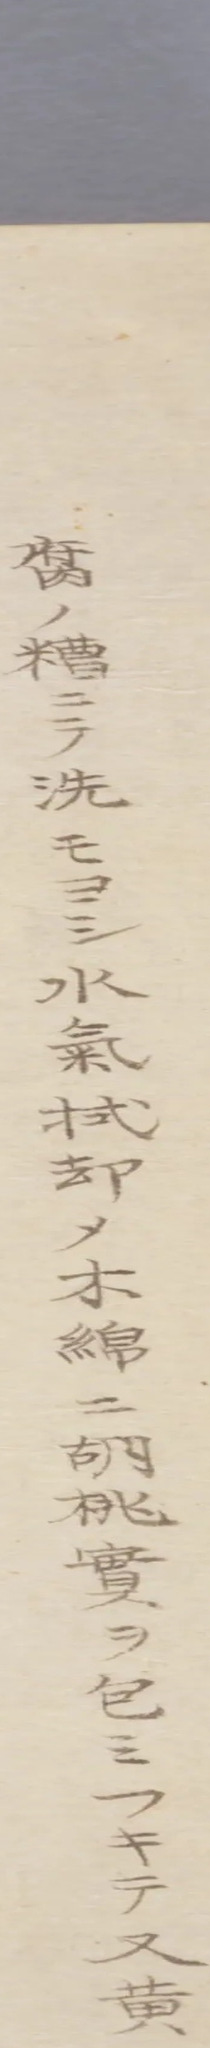腐ノ糟ニテ洗モヨシ水気拭却シテ木綿ニ胡桃実ヲ包ミフキテ又黄
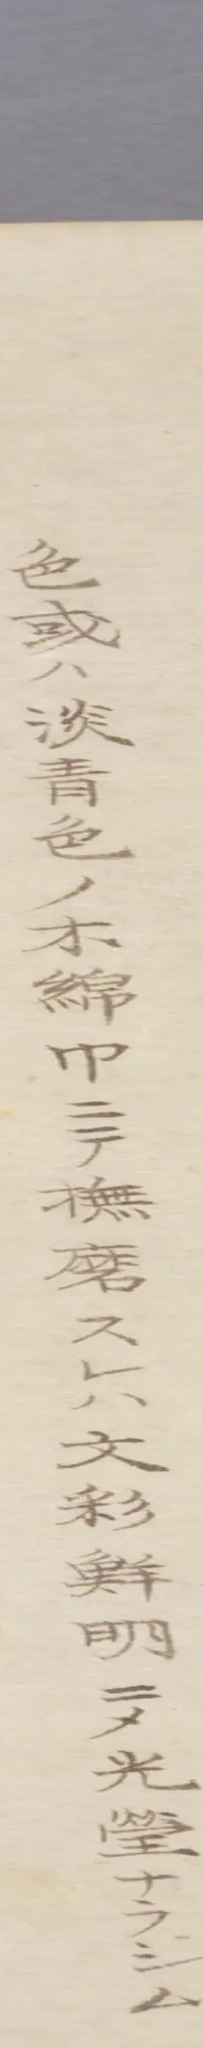色或ハ淡青色ノ木綿巾ニテ撫磨スレハ文彩鮮明ニシテ光宝ナラシム
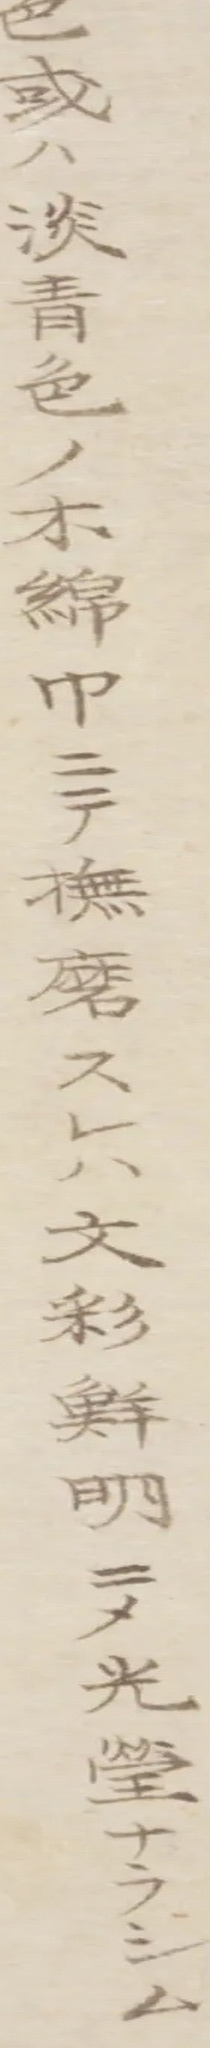色或ハ淡青色ノ木綿巾ニテ撫磨スレハ文彩鮮明ニシテ光宝ナラシム
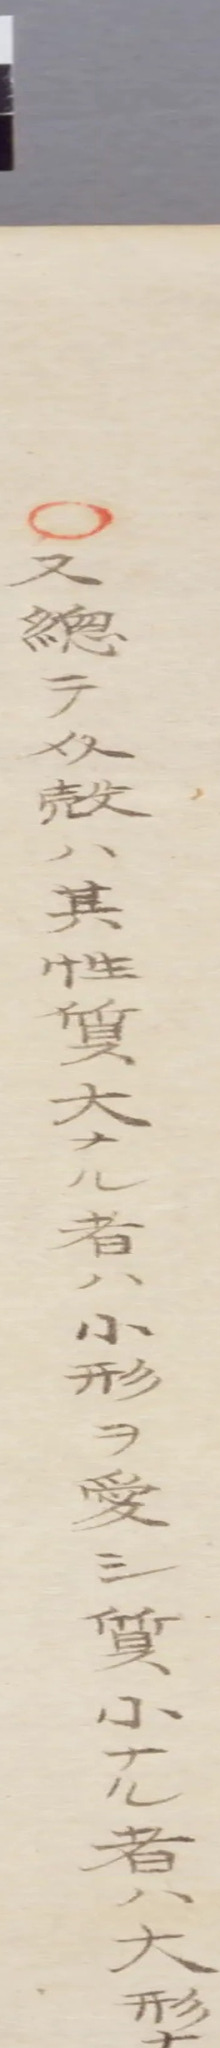○又総テ介殻ハ其性質大ナル者ハ小形ヲ愛シ質小ナル者ハ大形ナ
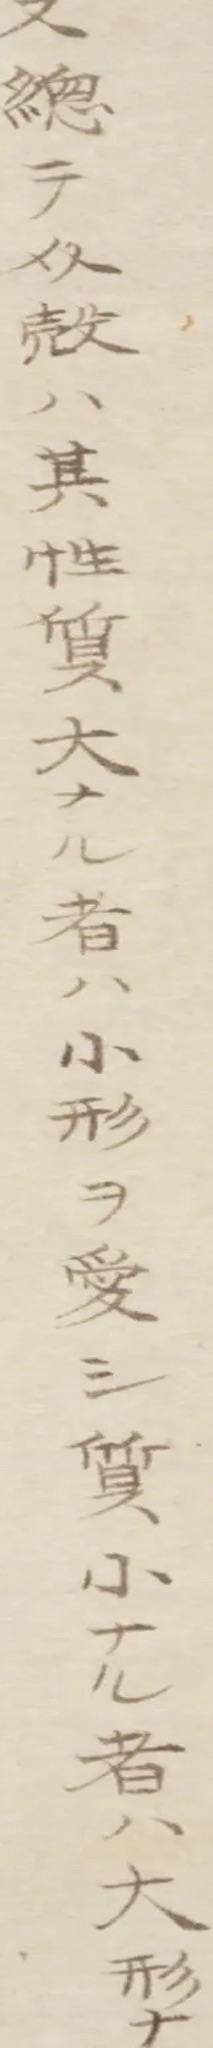○又総テ介殻ハ其性質大ナル者ハ小形ヲ愛シ質小ナル者ハ大形ナ
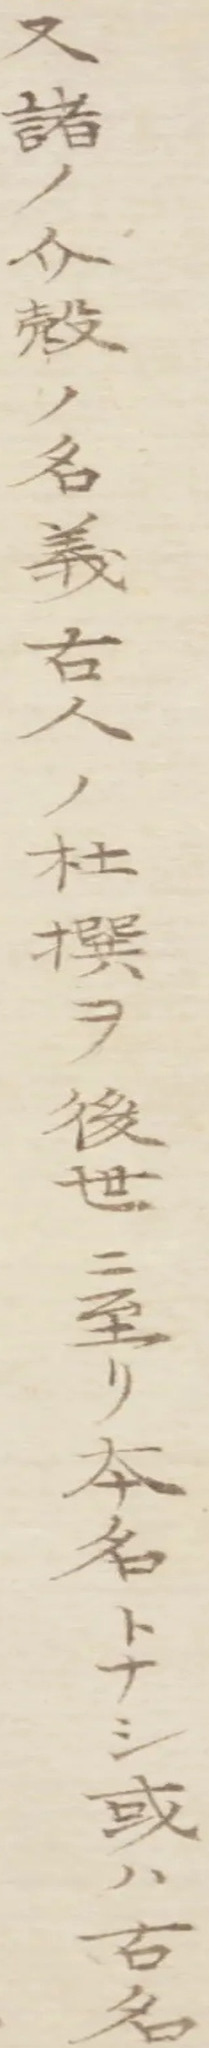○又諸ノ介殻ノ名義右人ノ杜撰ヲ後世ニ至リ本名トナシ或ハ古名
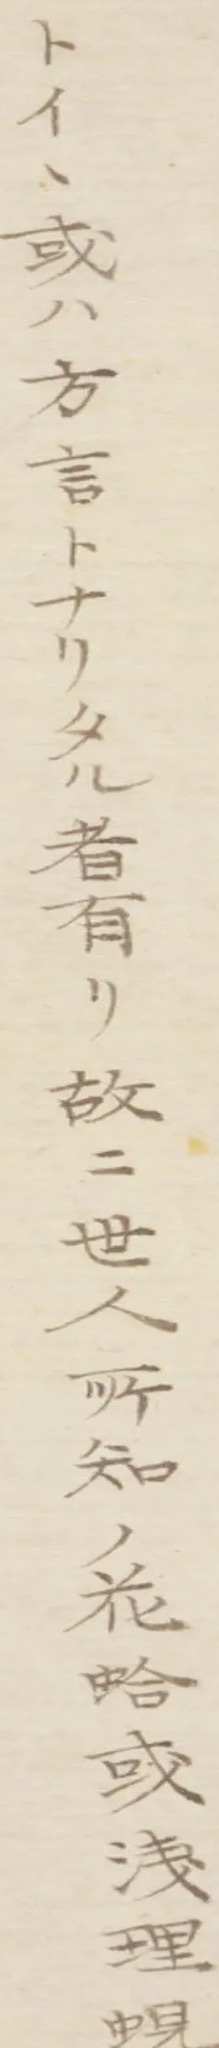トイゝ或ハ方言トナリタル者有リ故ニ世人所知ノ花蛤或浅理蛽
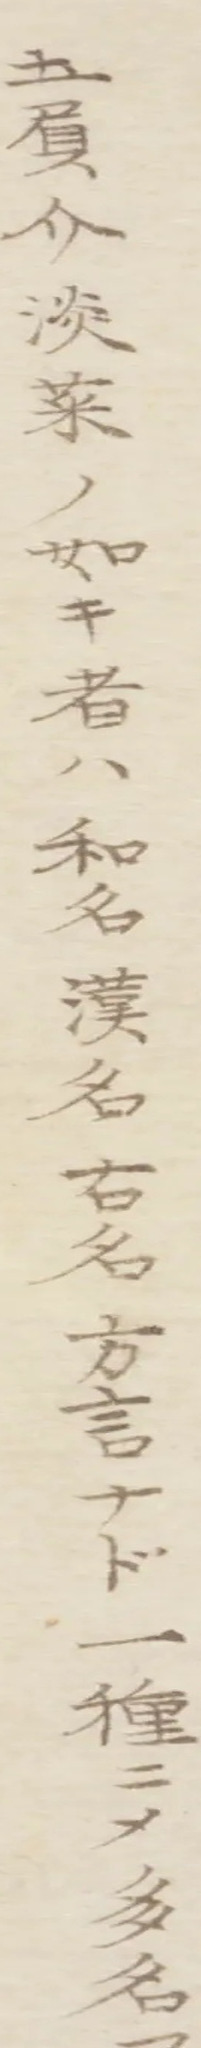土屓貝淡菜ノ如キ者ハ和名漢名古名方言ナド一種ニシテ多名アリ
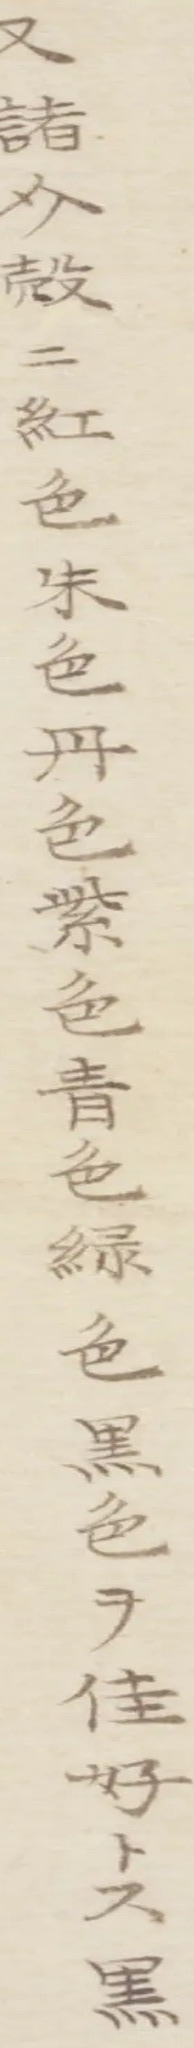○又諸介殻ニ紅色朱色丹色紫色青色緑色黒色ヲ佳好トス黒
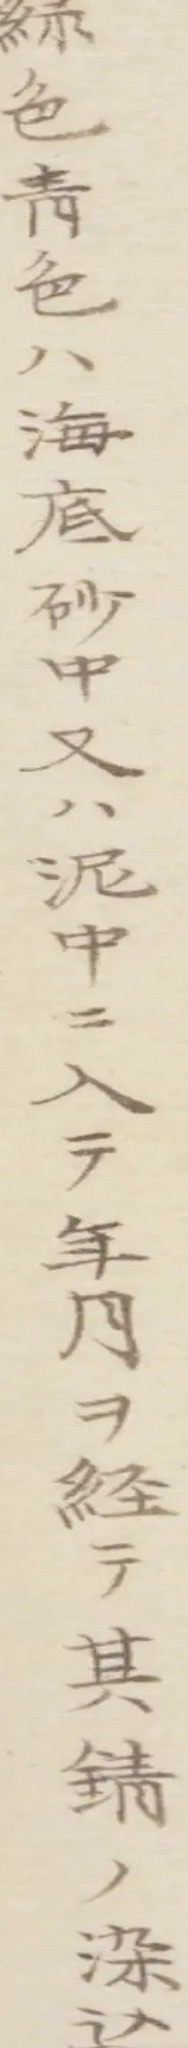色緑色青色ハ海底砂中又ハ泥中ニ入テ年月ヲ経テ其錆ノ染込
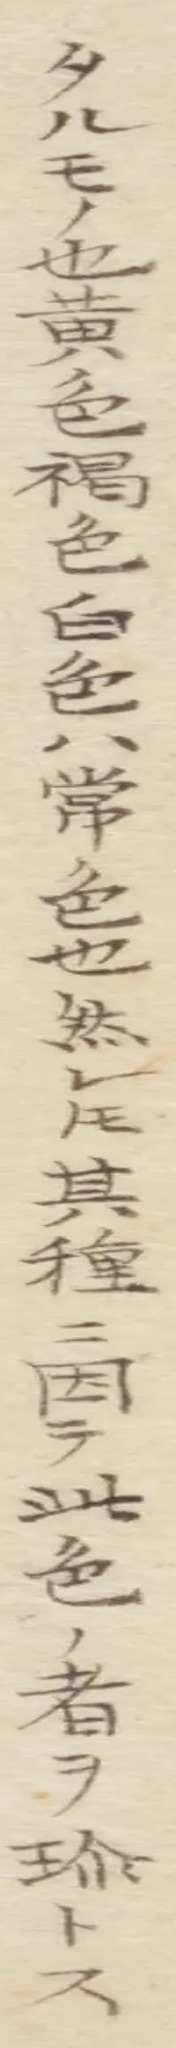タルモノ也黄色褐色白色ハ常色也然レトモ其種ニ因テ此色ノ者ヲ珍トス
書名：目八譜. 第１巻
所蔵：国立国会図書館 National Diet Library, JAPAN
